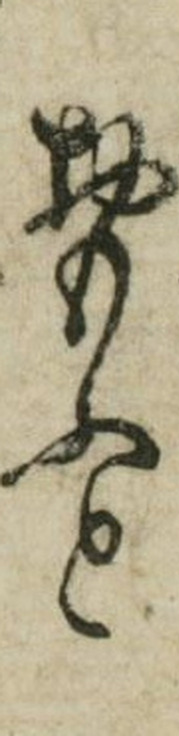おもふと
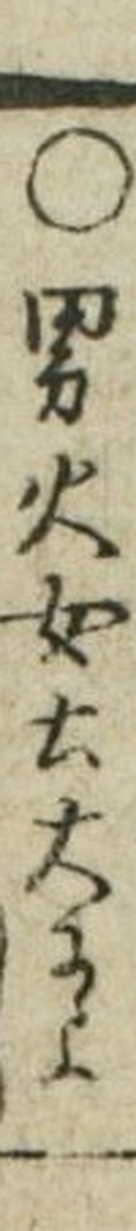○男火女土大によし
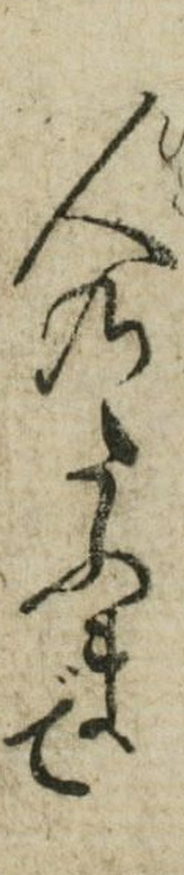人のとふまで
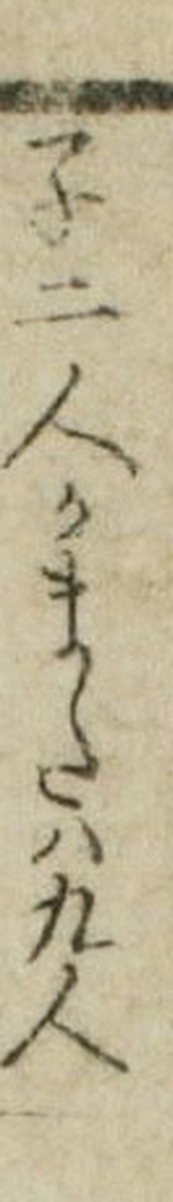子二人かまたは九人
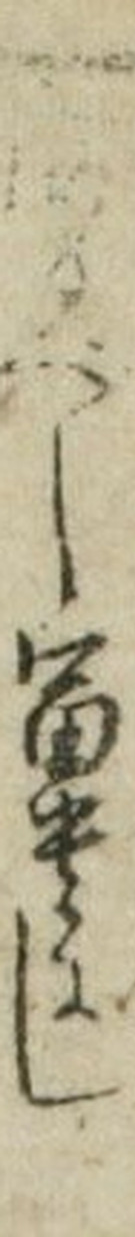あるべし富貴にし
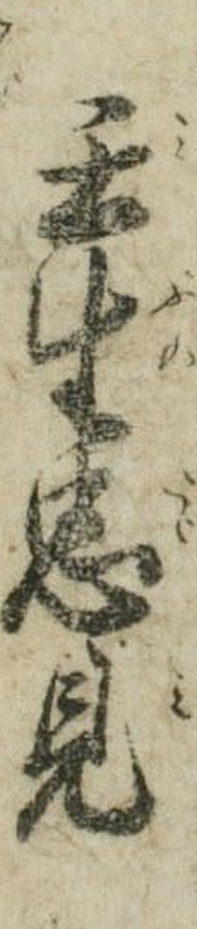壬生忠見
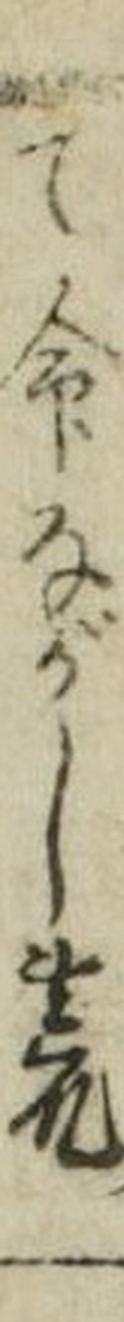て命ながし荒
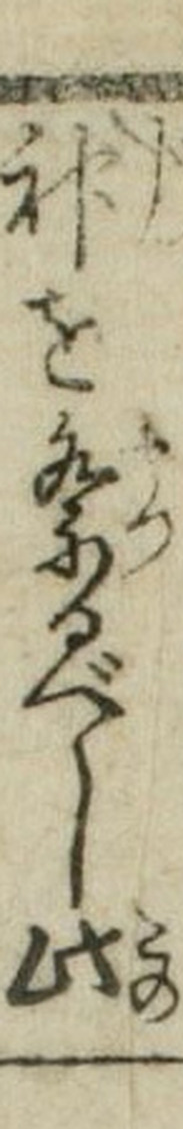神を祭るべし此
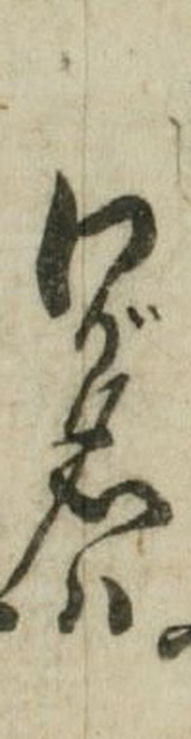わが名は
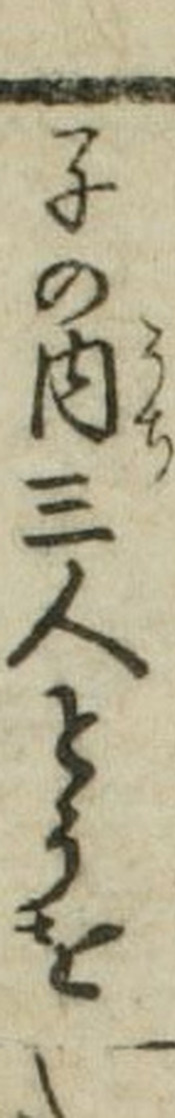子の内三人とうを
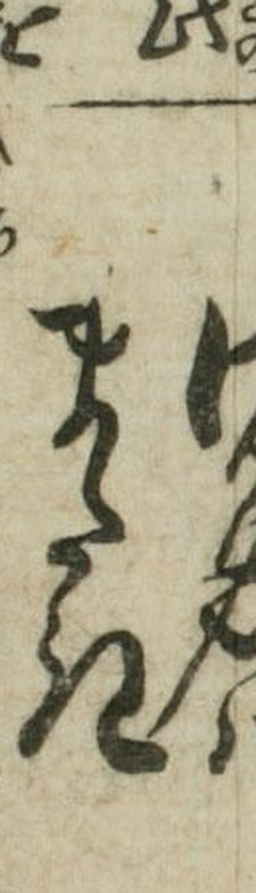またき
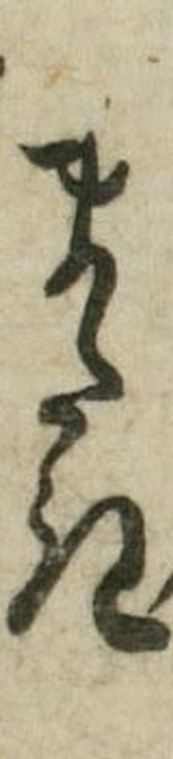またき
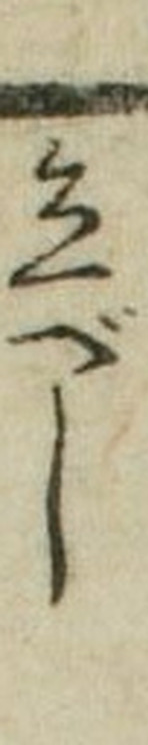立べし
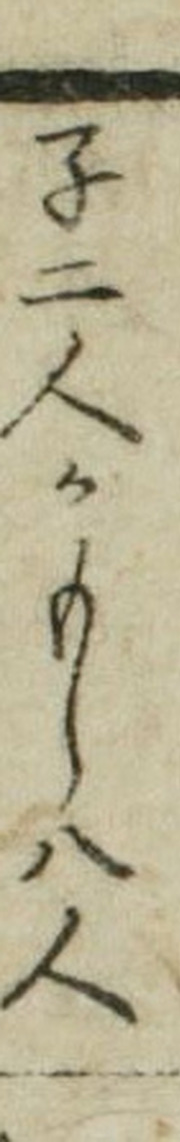子ふたりかもし八人
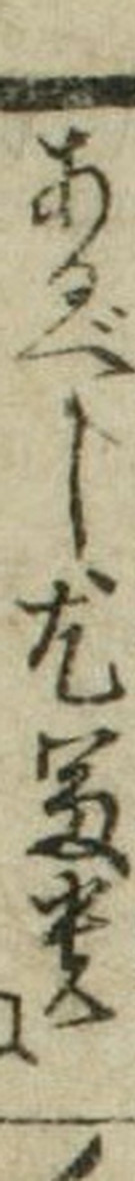あるべし尤富貴に
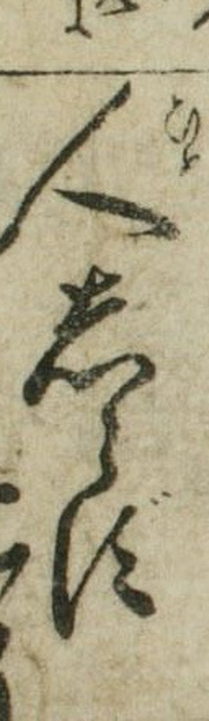人しらず
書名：百人一首
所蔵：東京学芸大学教育コンテンツアーカイブ
